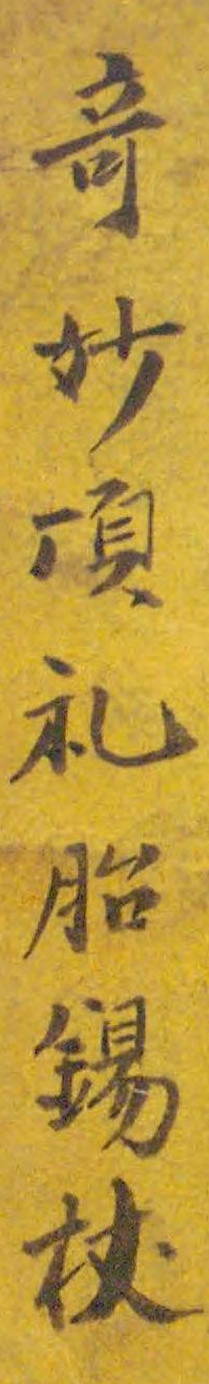奇妙頂礼胎錫杖

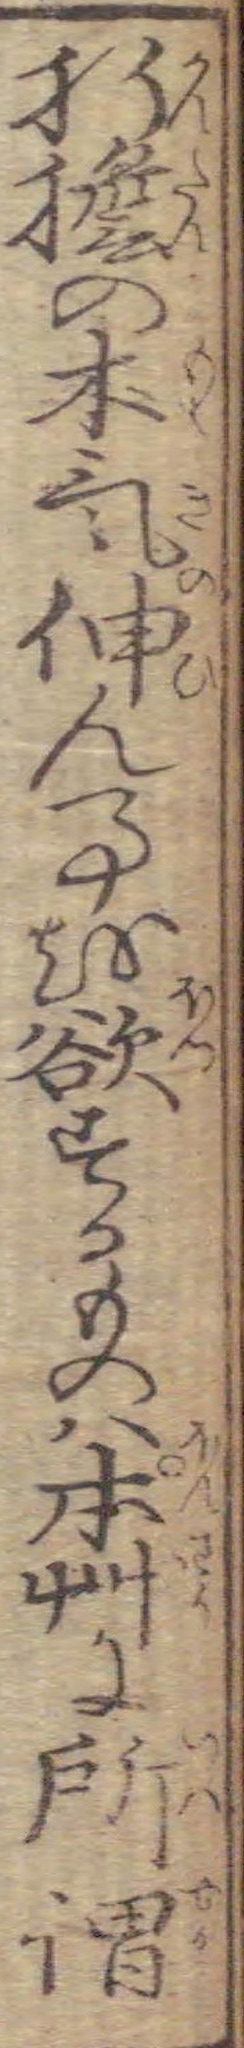肝胆の木気伸ん事を欲するものは。本艸に所謂
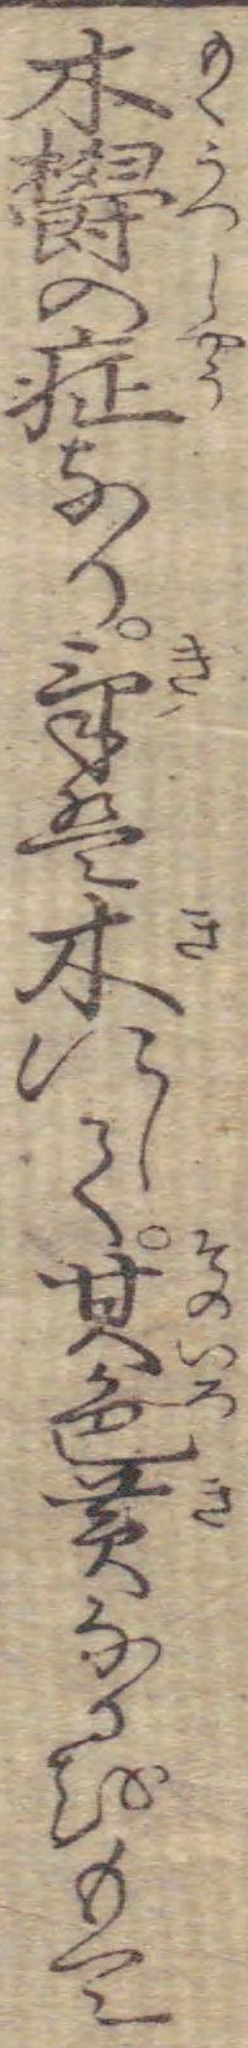木鬱の症なり。気は木にして。其色黄なるをもて
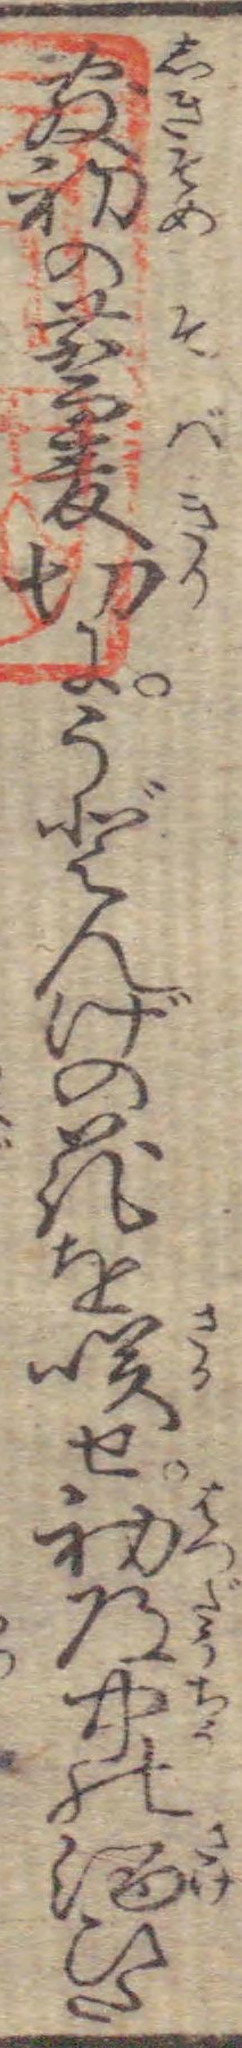敷初の蕎麦切に。うどんげの花を咲せ。初道中の酒ひた
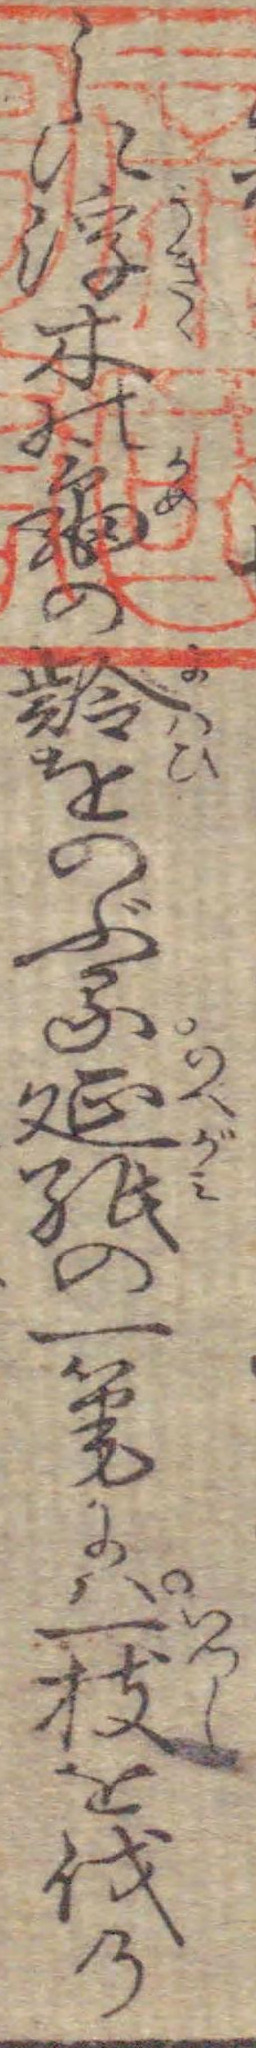しに浮木の亀の齢をのぶる。延紙の一筆には。一枝を伐の
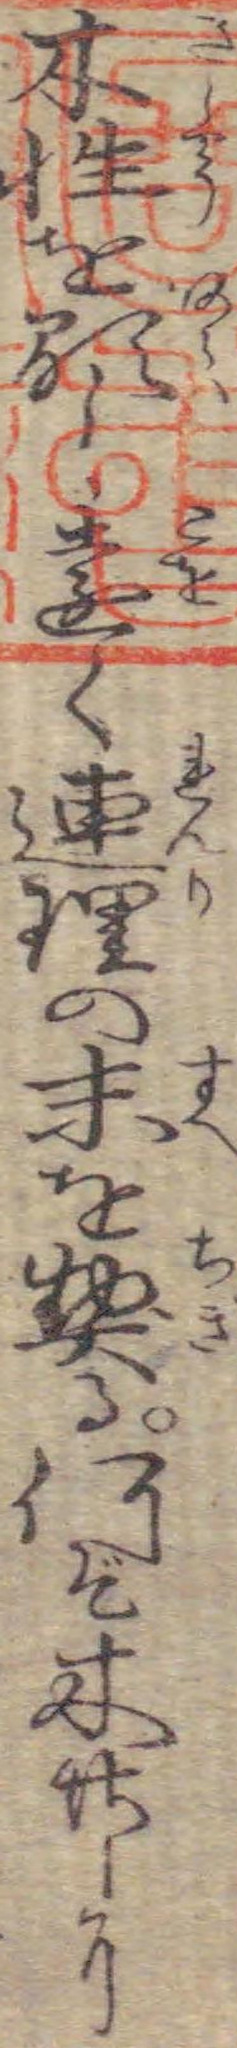木性顕し遠く連理の末を契る。何ぞ木さしに
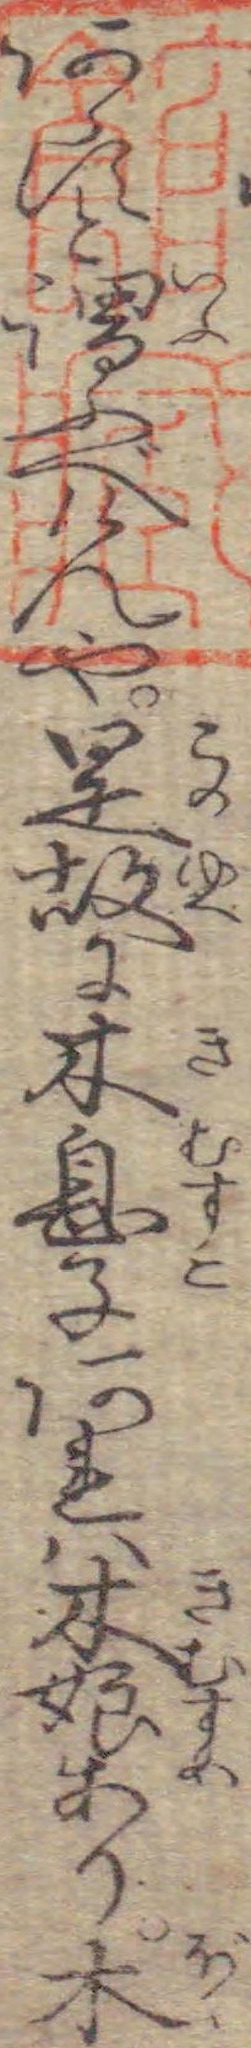あらすと謂ふべけんや。是故に木息子あれは木娘あり。木
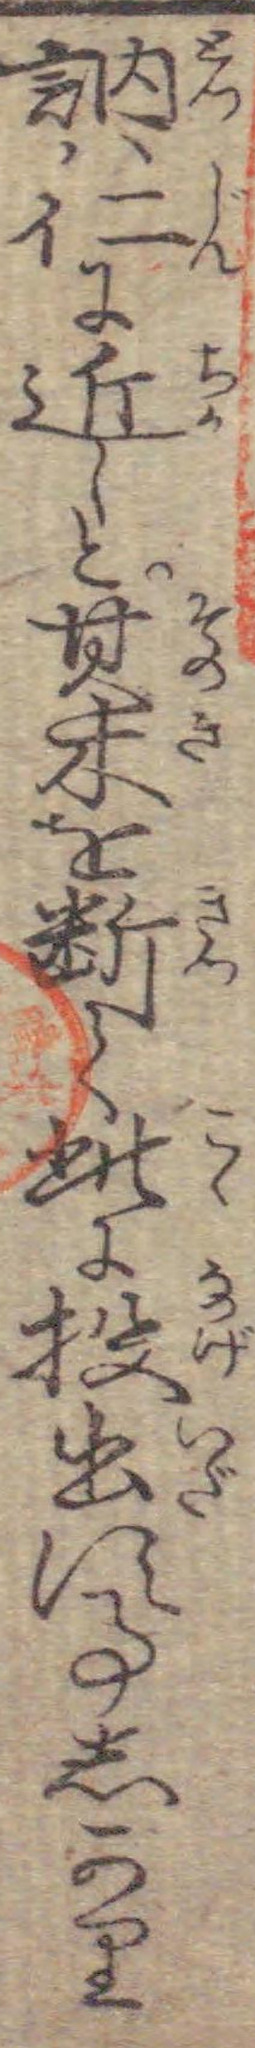訥は仁に近しと。其木を断て此に投出す事しかり
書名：奇妙頂礼胎錫杖 : 3巻
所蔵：国立国会図書館 National Diet Library, JAPAN
